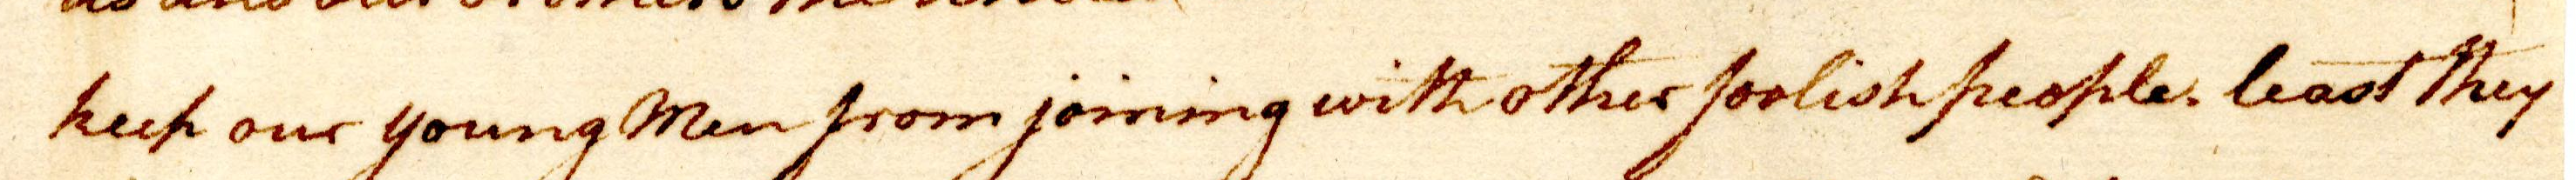keep our young Men from joining with other foolish people least they
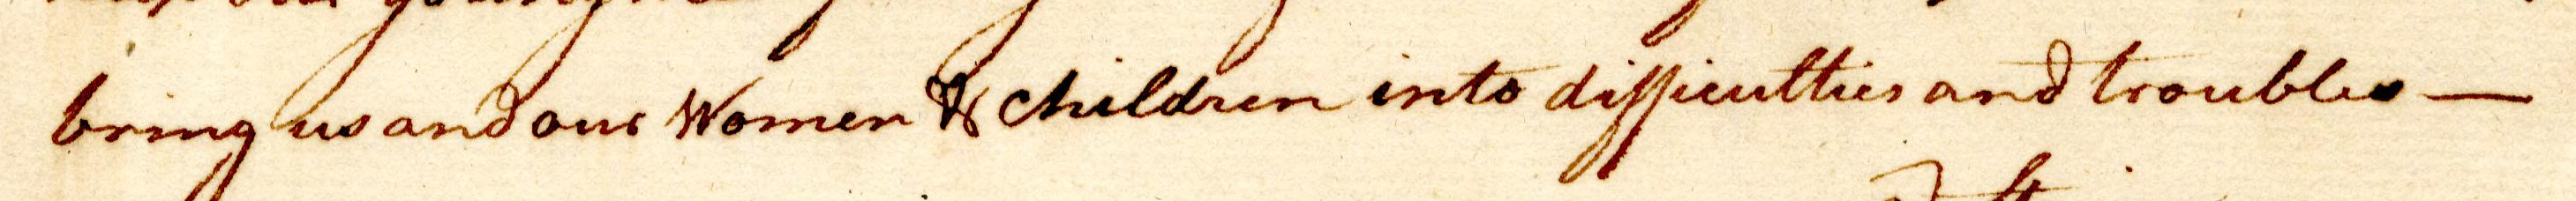bring us and our Woman & children into difficulties and troubles-
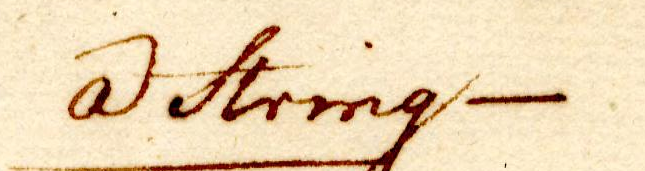a String-
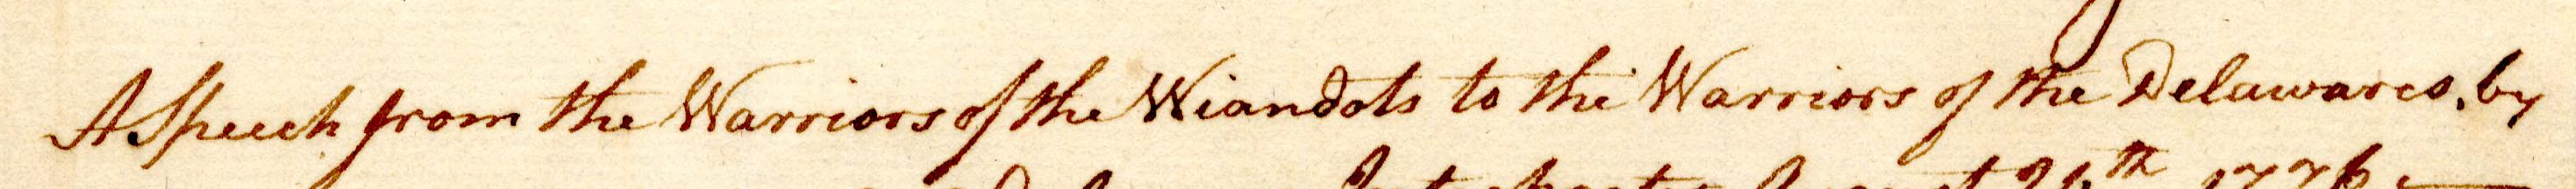A Speech from the Warriors of the Wiandots to the Warriors of the Delawares, by
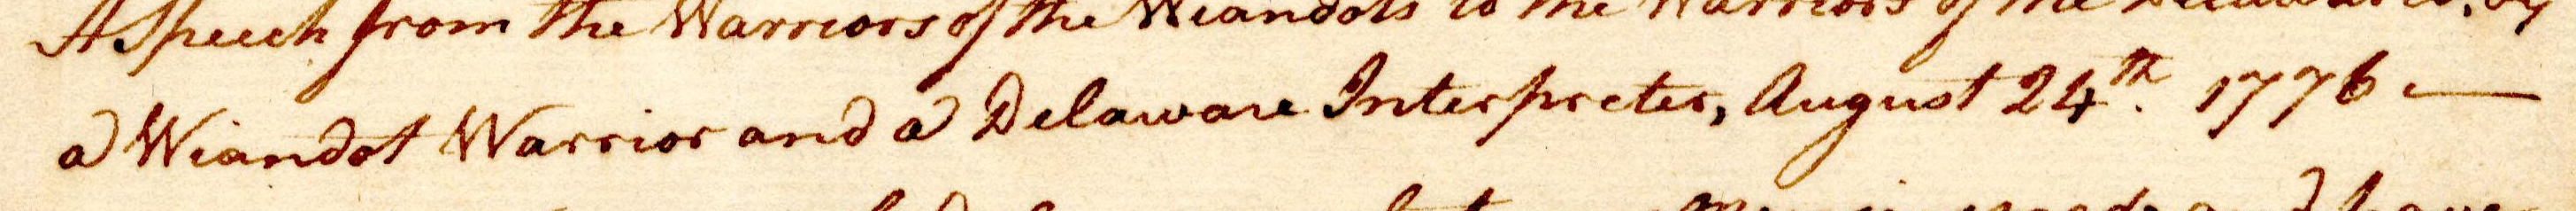a Wiandot Warrior and a Delaware Interpreter, August 24^th. 1776-
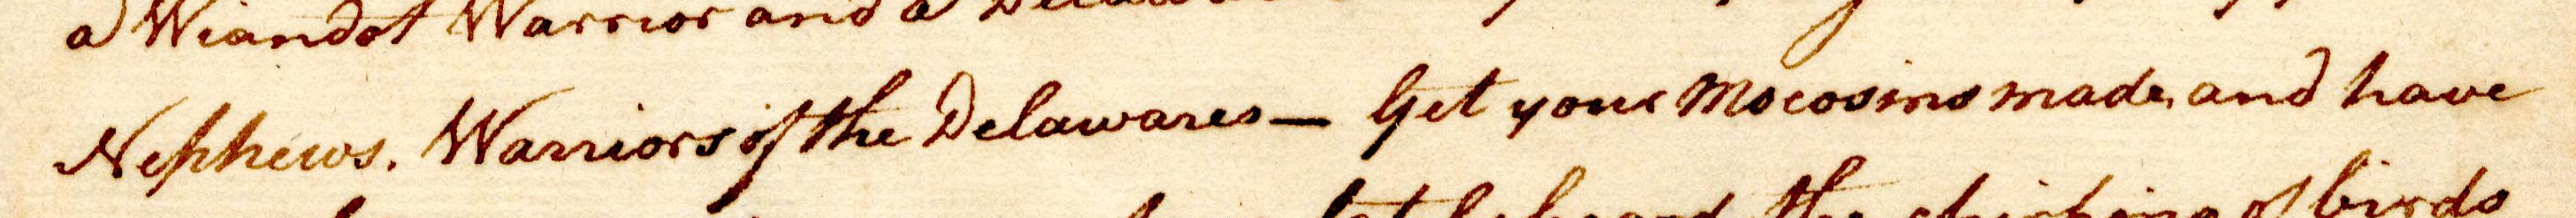Nephews. Warriors of the Delawares- Get your Mocosins made, and have
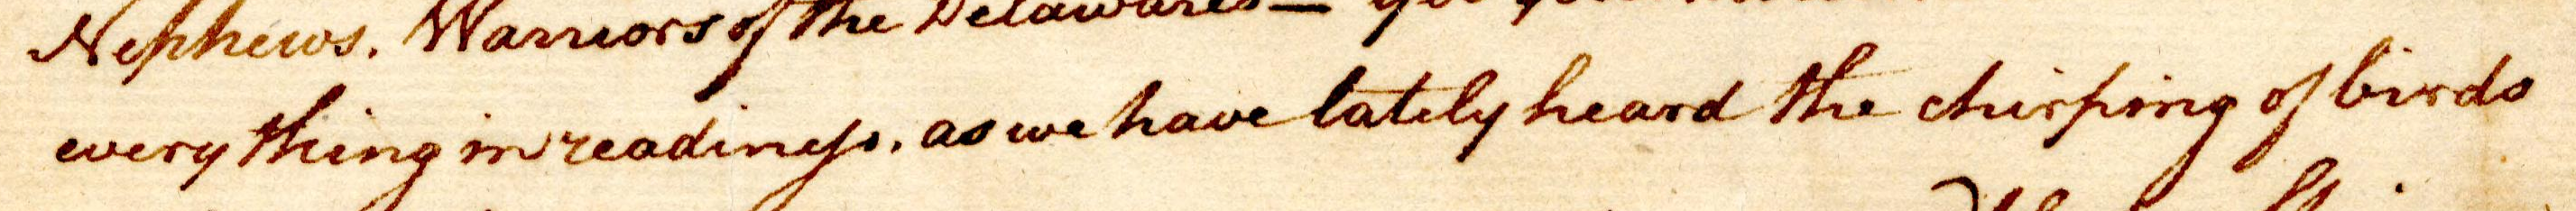every thing in readiness, as we have lately heard the chirping of birds
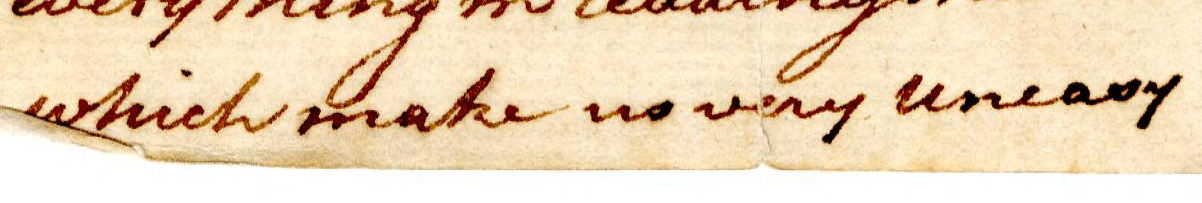which make us very uneasy
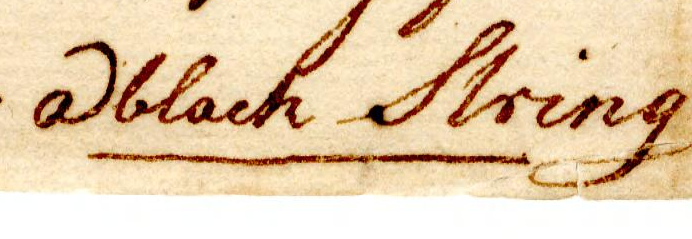a black String
